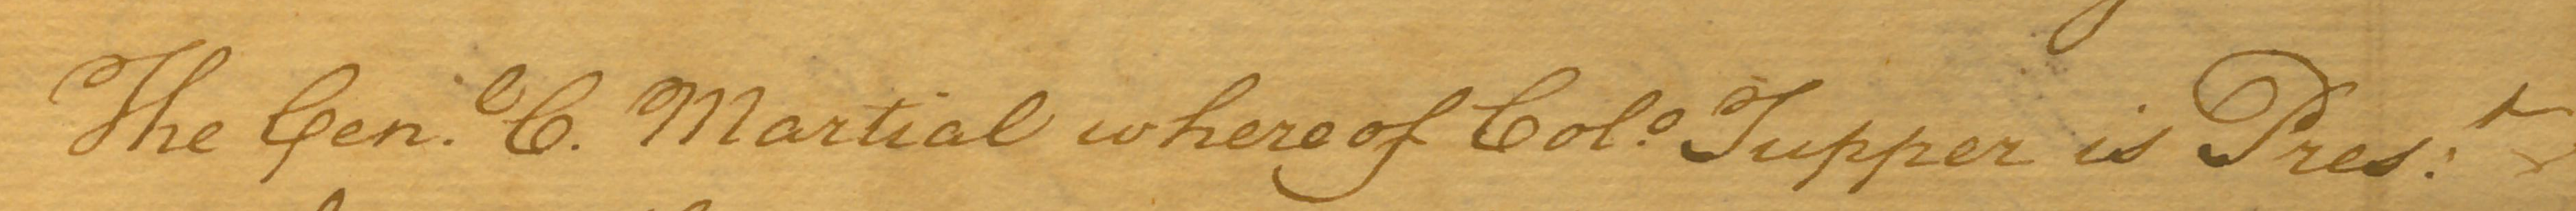The Gen^l. C. Martial whereof Col^o. Tupper is Pres^t:
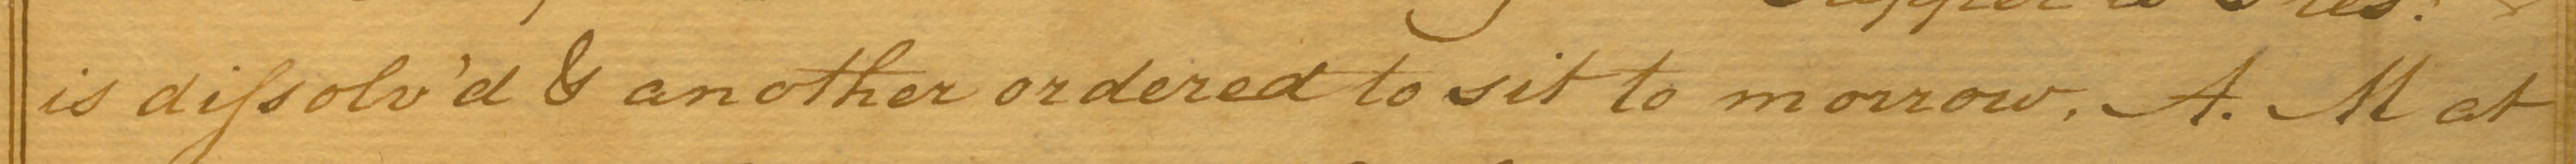is dissolv'd & another ordered to sit to morrow. A. M at
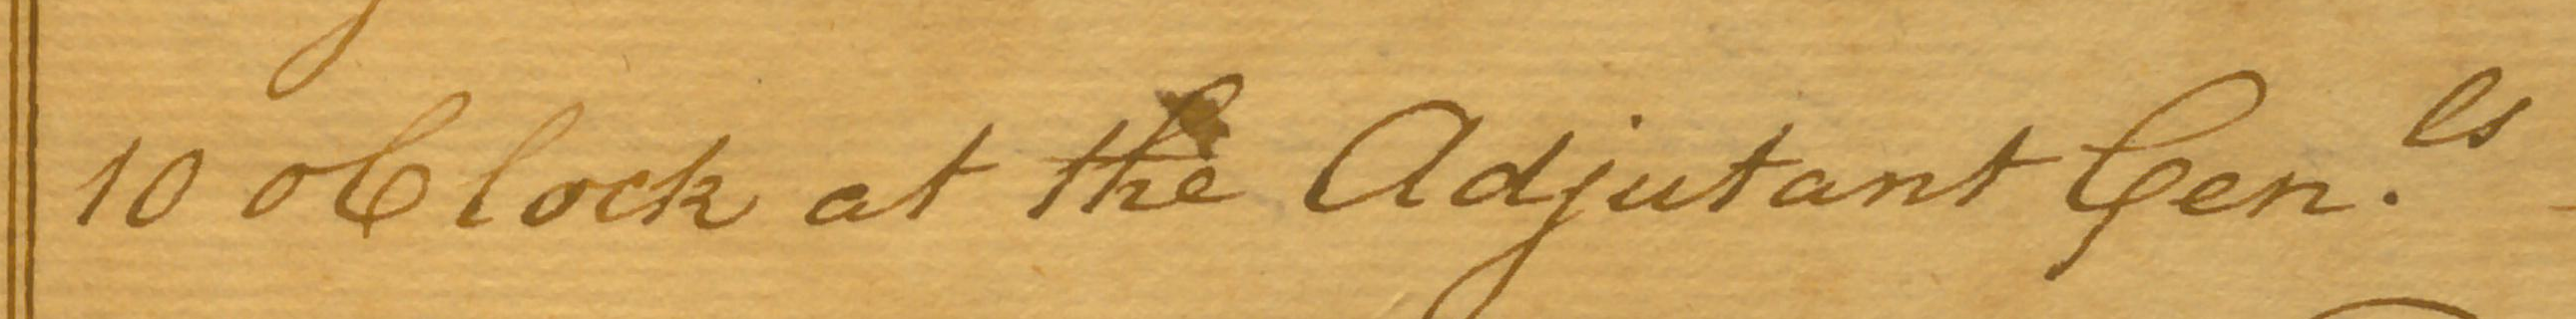10 oClock at the Adjutant Gen^ls.
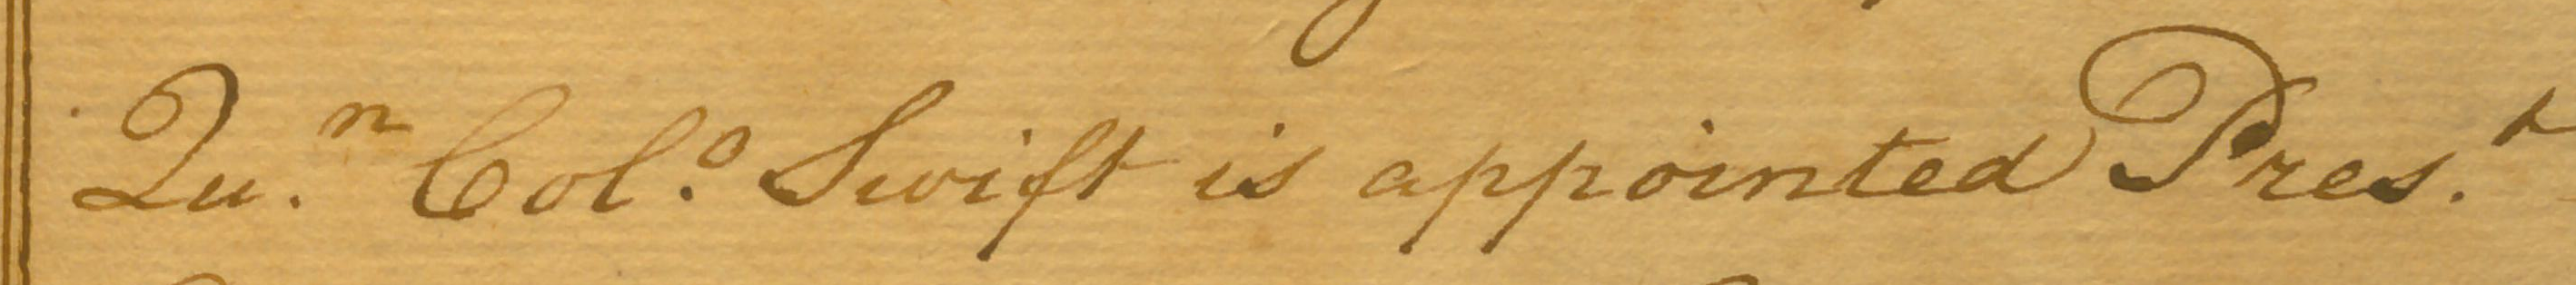Qu^n. Col^o. Swift is appointed Pres^t.
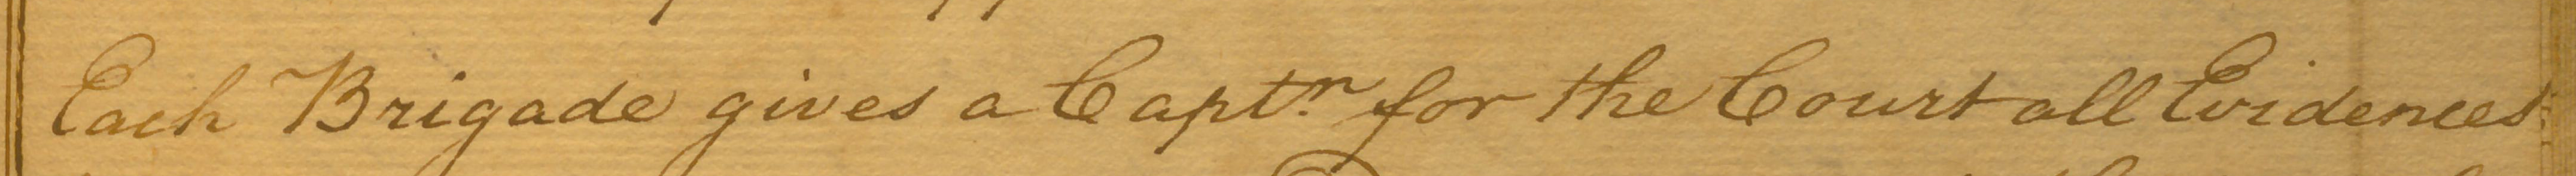Each Brigade gives a Capt^n. for the Court all Evidences
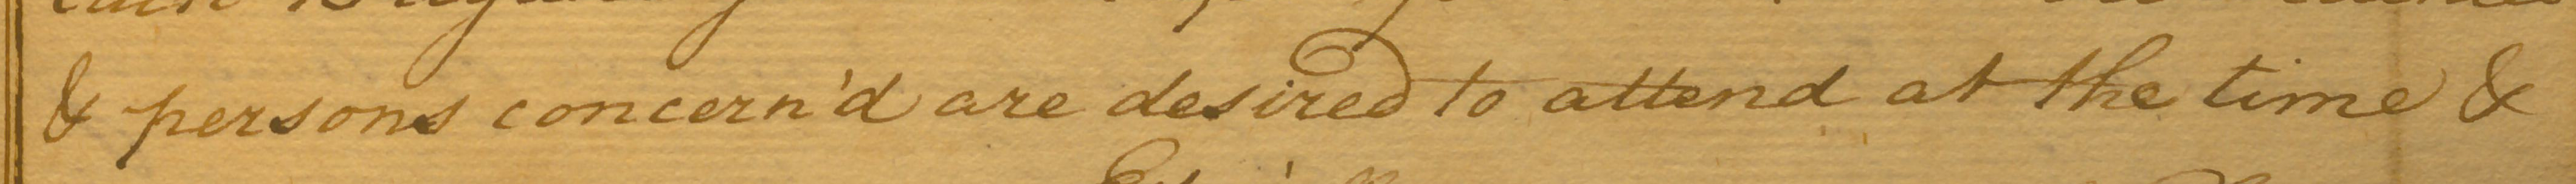& persons concern'd are desired to attend at the time &
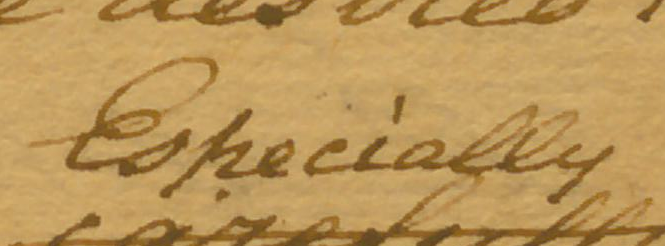Especially
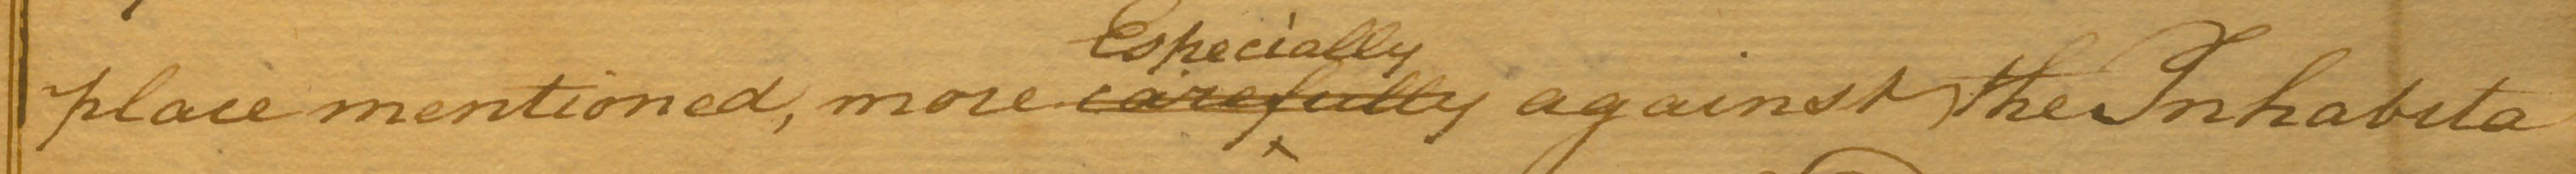place mentioned, more ^ [carefully] against the Inhabita
